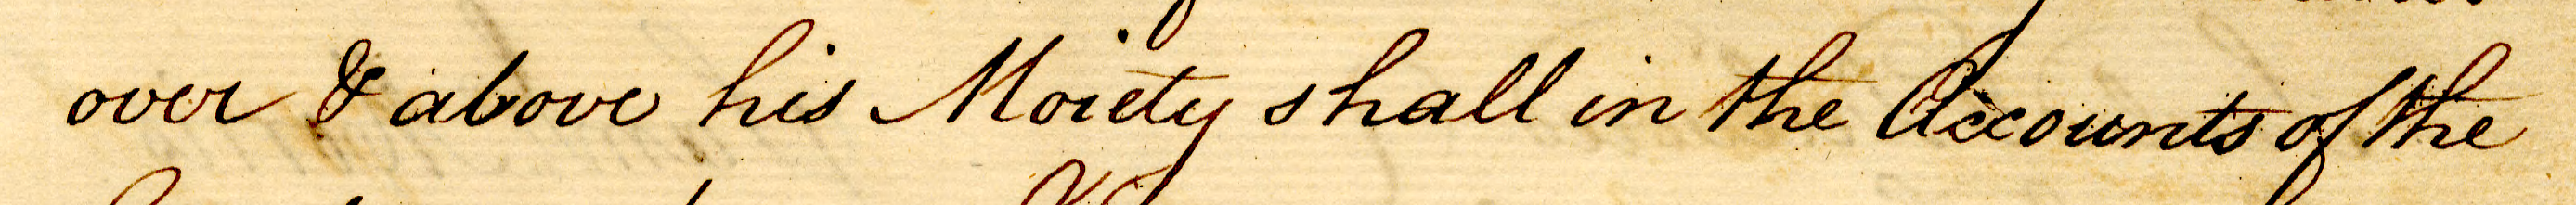over & above his Moiety shall in the Accounts of the
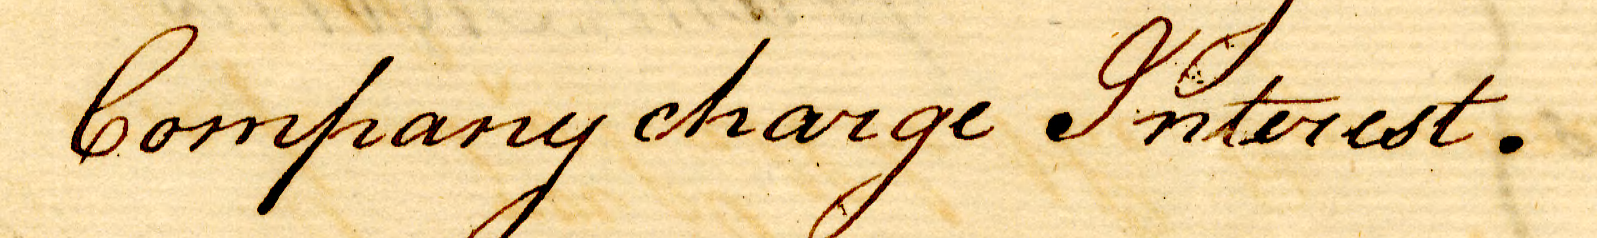Company charge Interest.
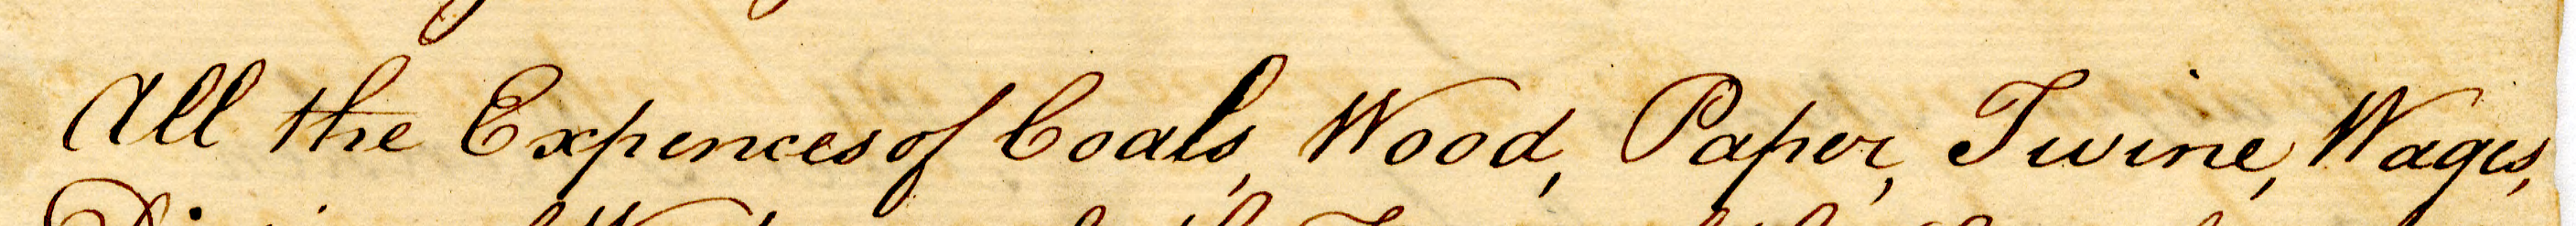All the Expences of Coals, Wood, Paper, Twine, Wages,
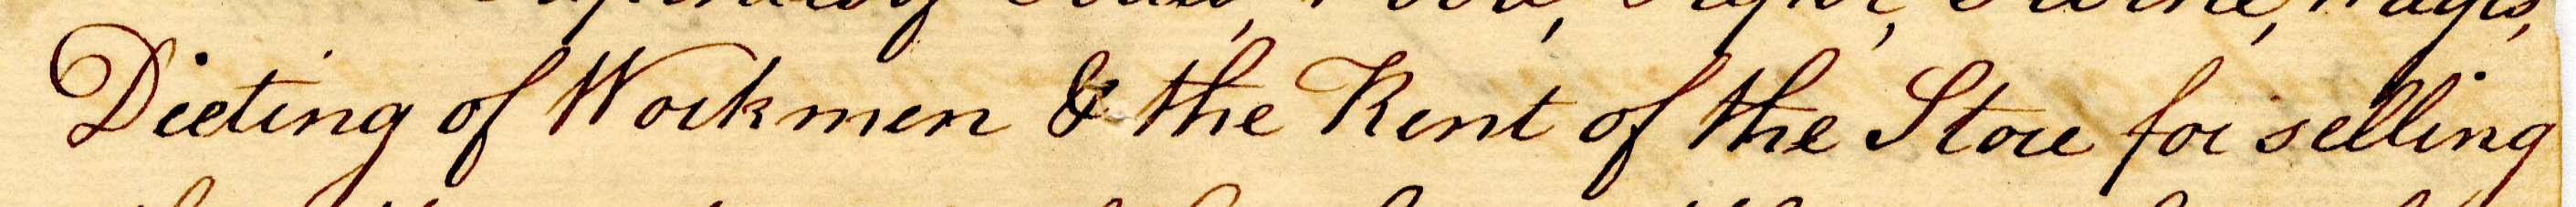Dieting of Workmen & the Rent of the Store for selling
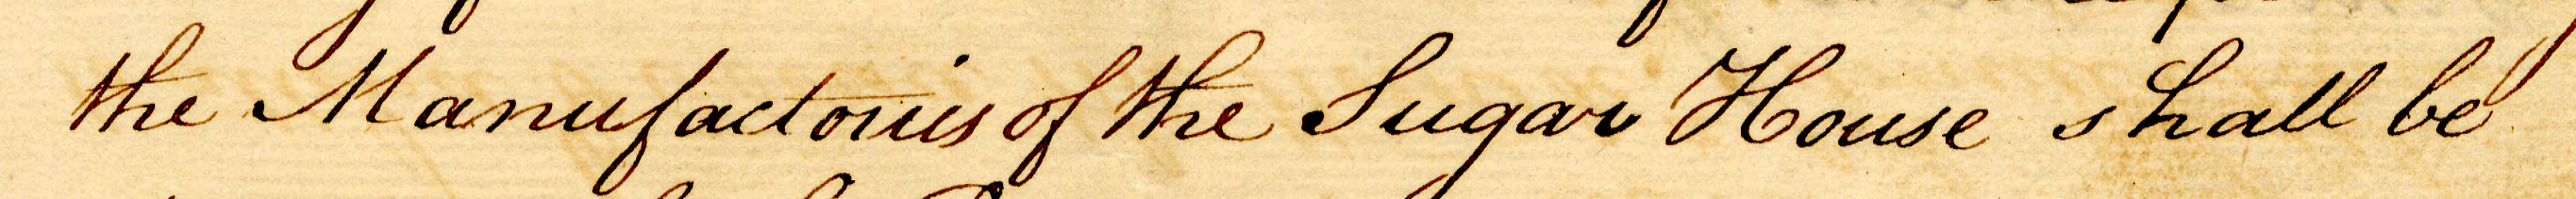The Manufactories of the Sugar House shall be
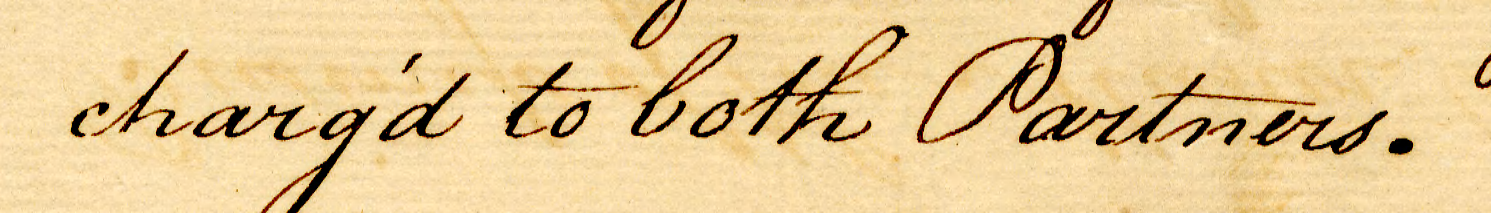charg’d to both Partners.
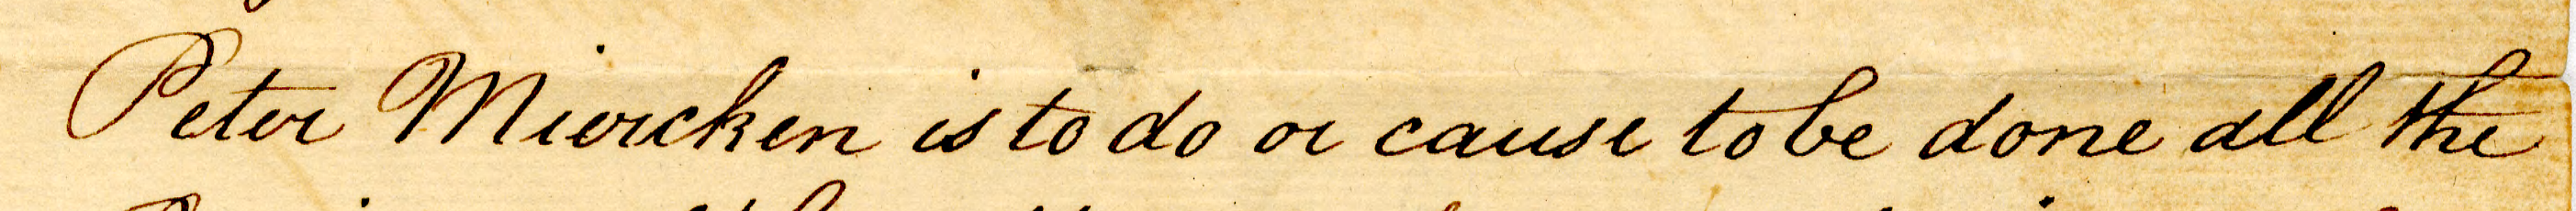Peter Miercken is to do or cause to be done all the
